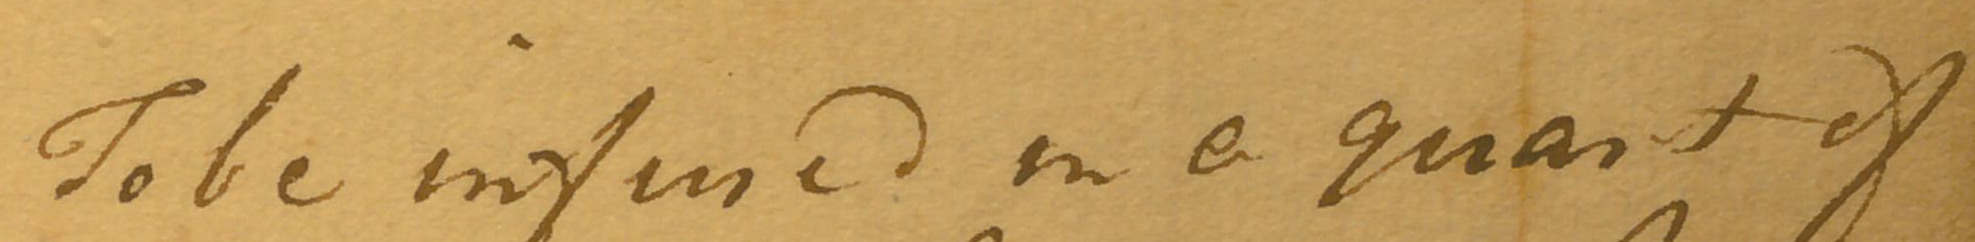To be infused in a quart of
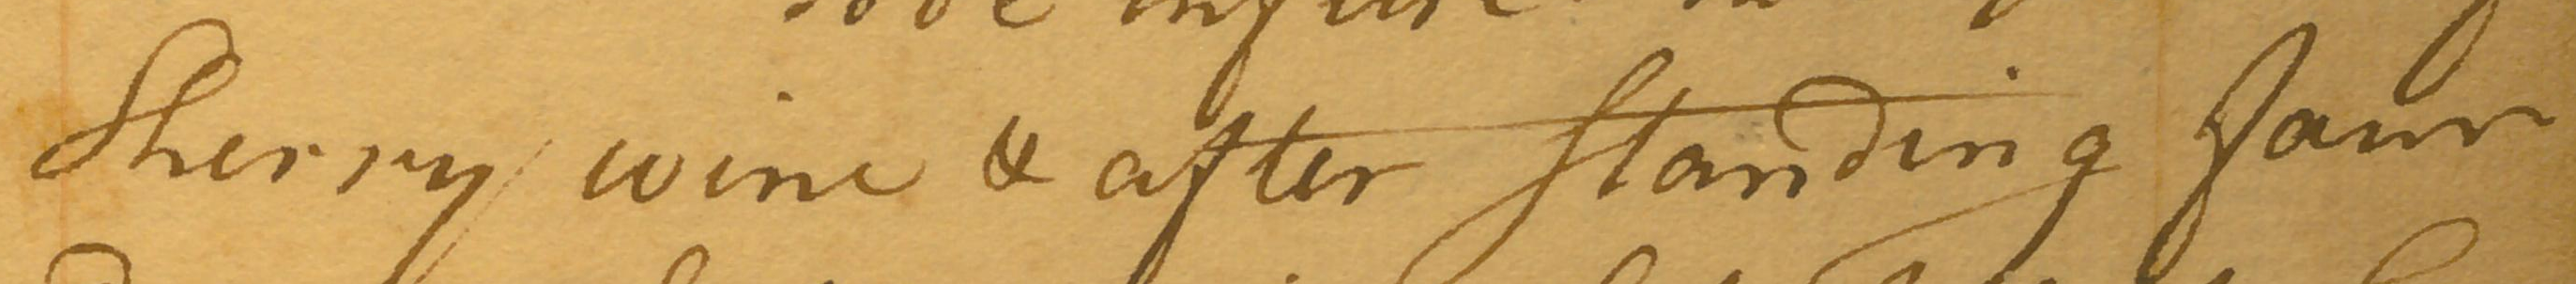Sherry wine & after standing faur
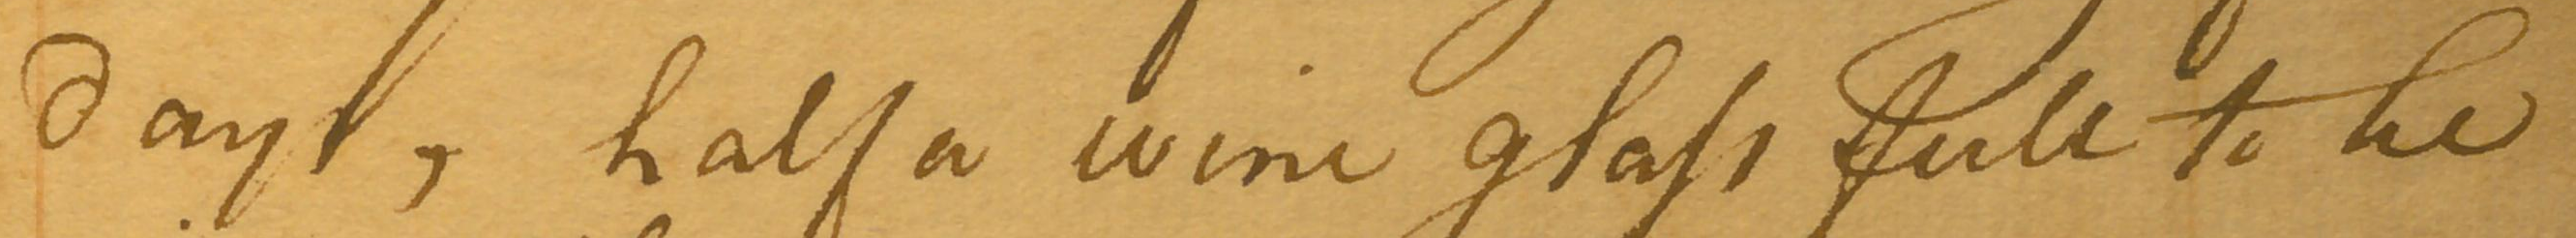days, half a wine glass full to be
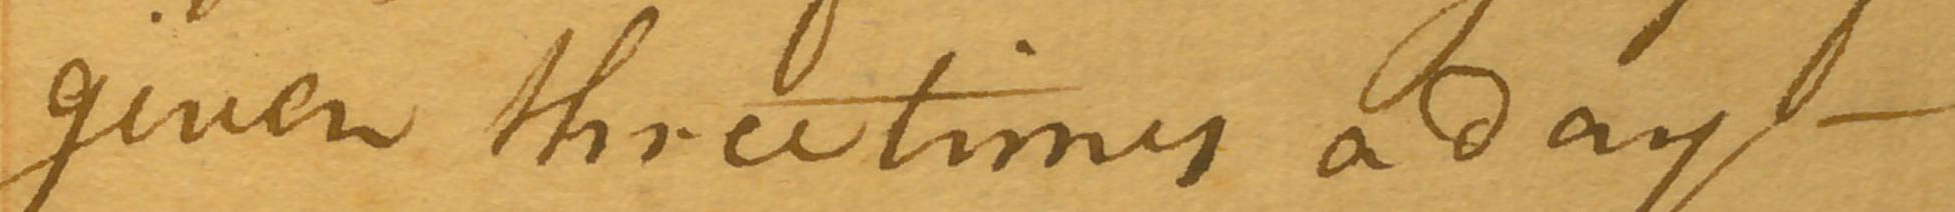given three times a day
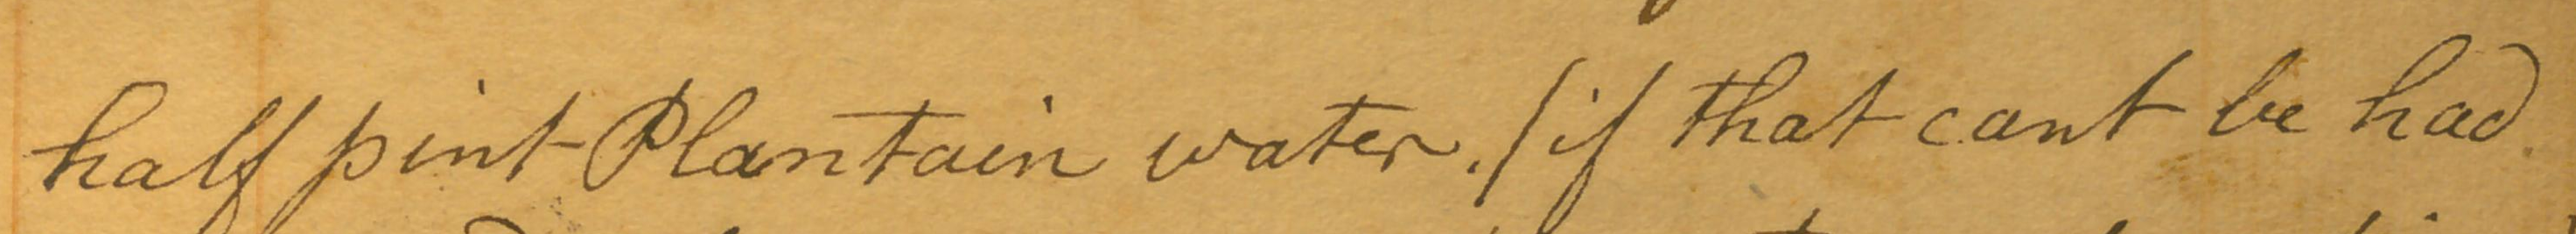half pint Plantain ater. /if that cant be had
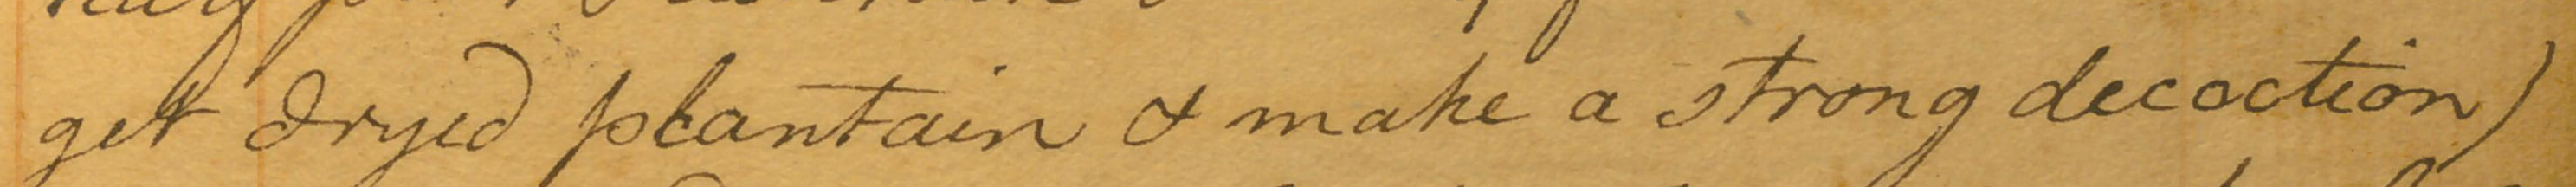get dryed plantain & make a strong decoction/
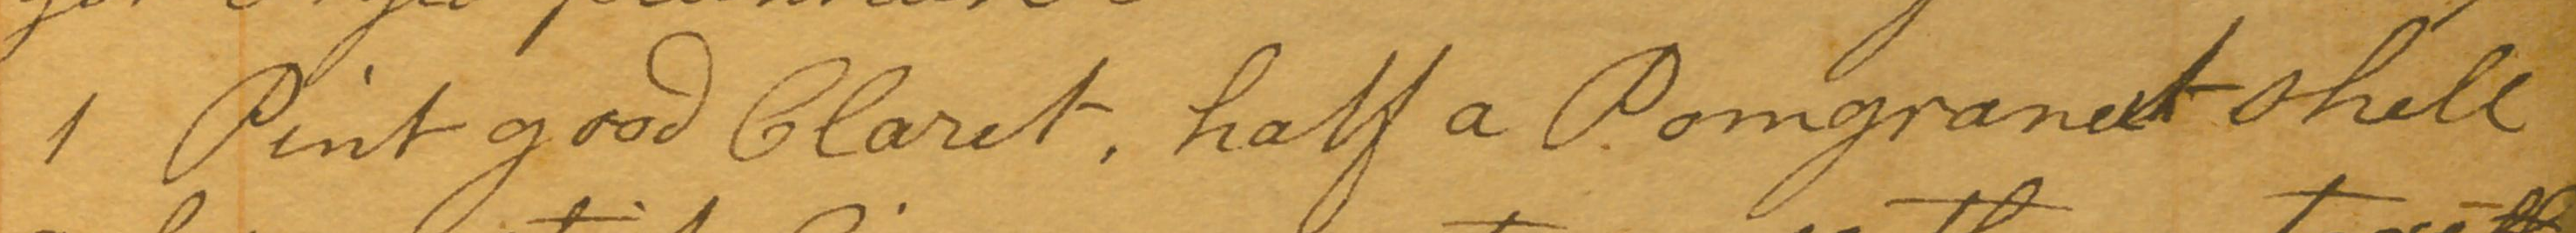1 Pint good Claret, half a Pomgranut shall
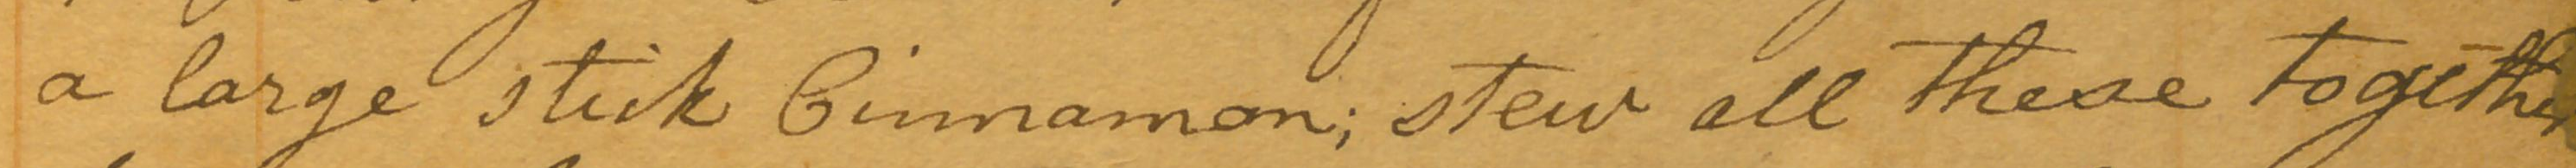a large stick Cinnamon; stew all these together
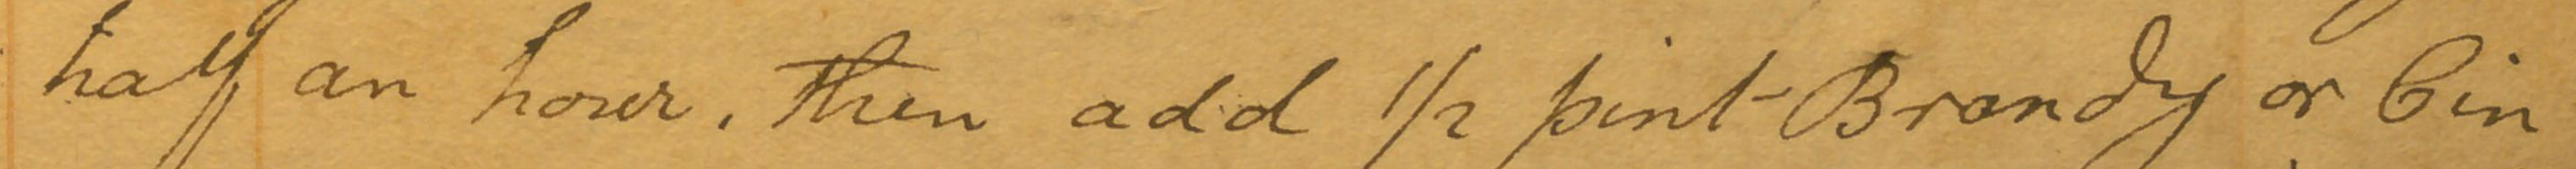half an hour, then add 1/2 pint Brandy or Cin
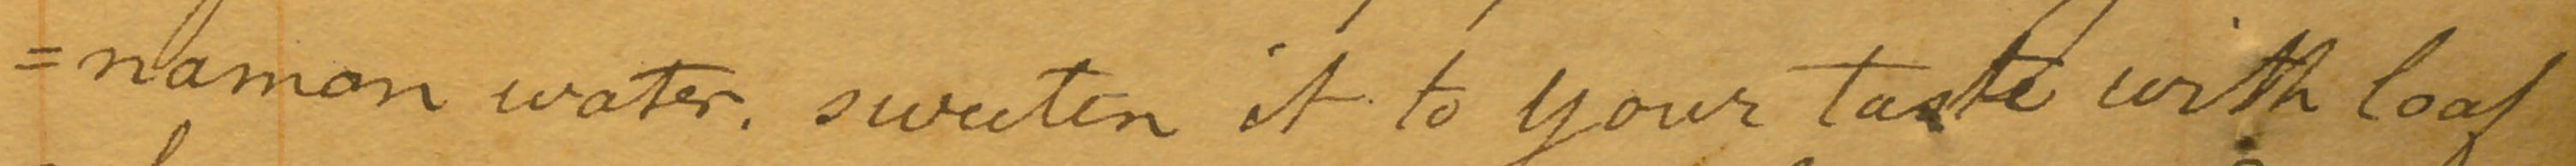-namon water, sweeten it to your taste with loaf
